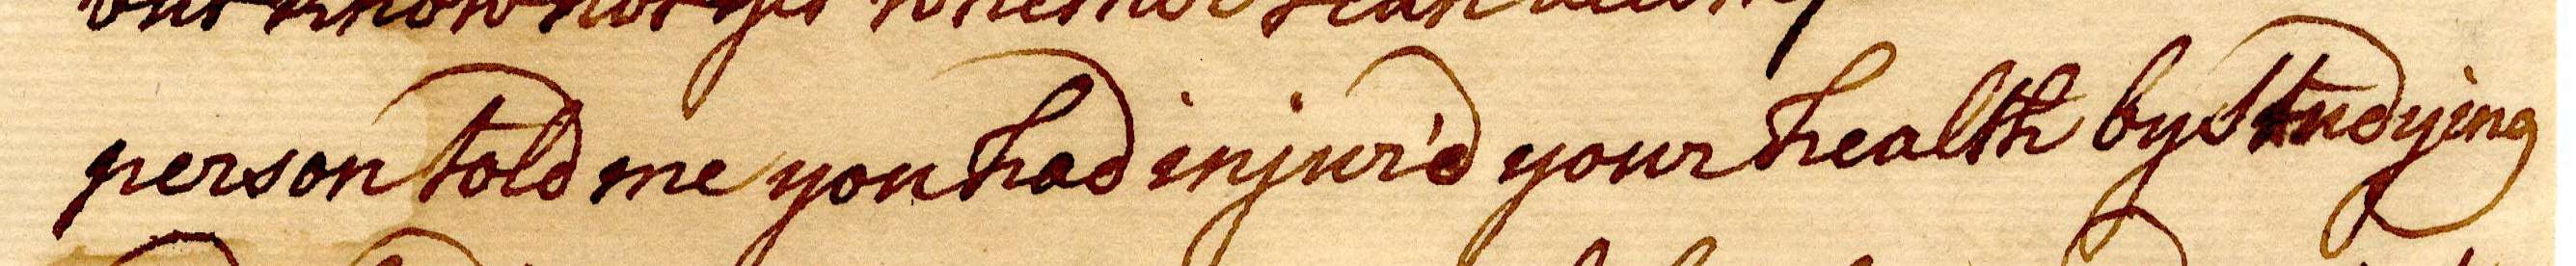person told me you had injur'd your health by studying
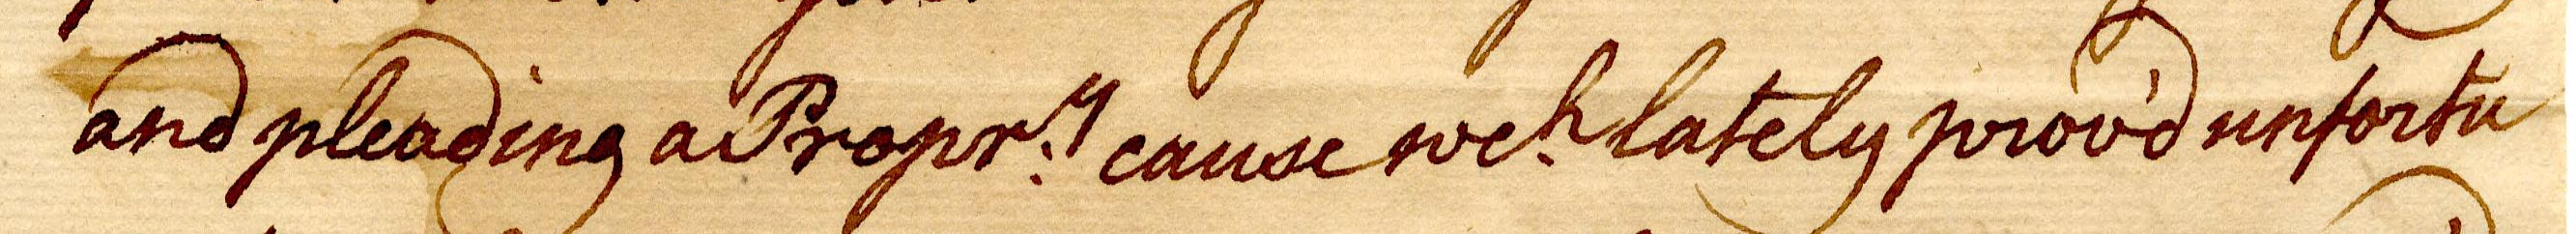and pleading a Propr^y cause wc^h. lately prov'd unfortu
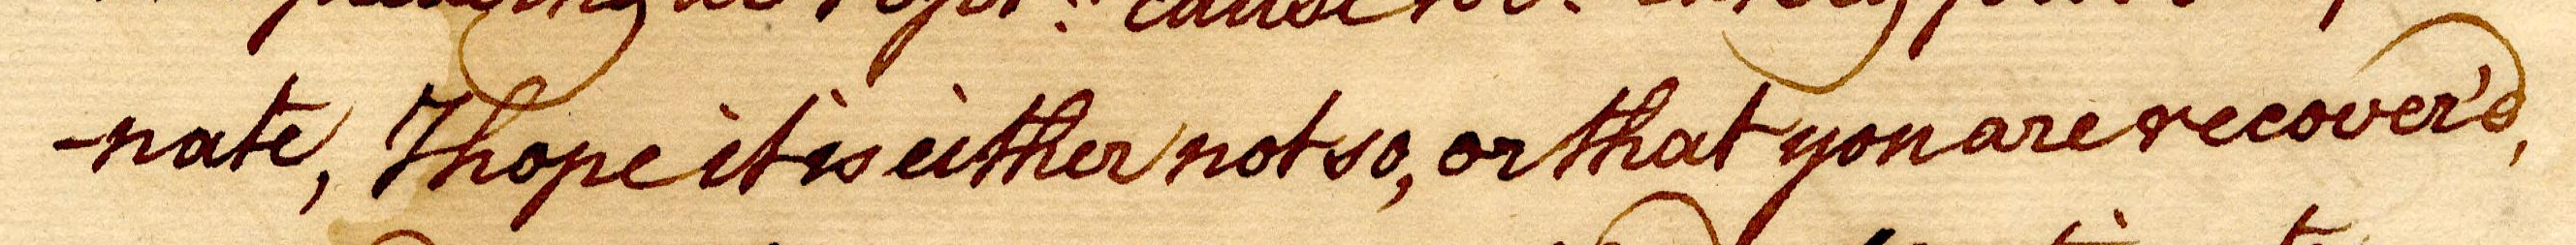-nate, I hope it is either not so, or that you are recover'd,
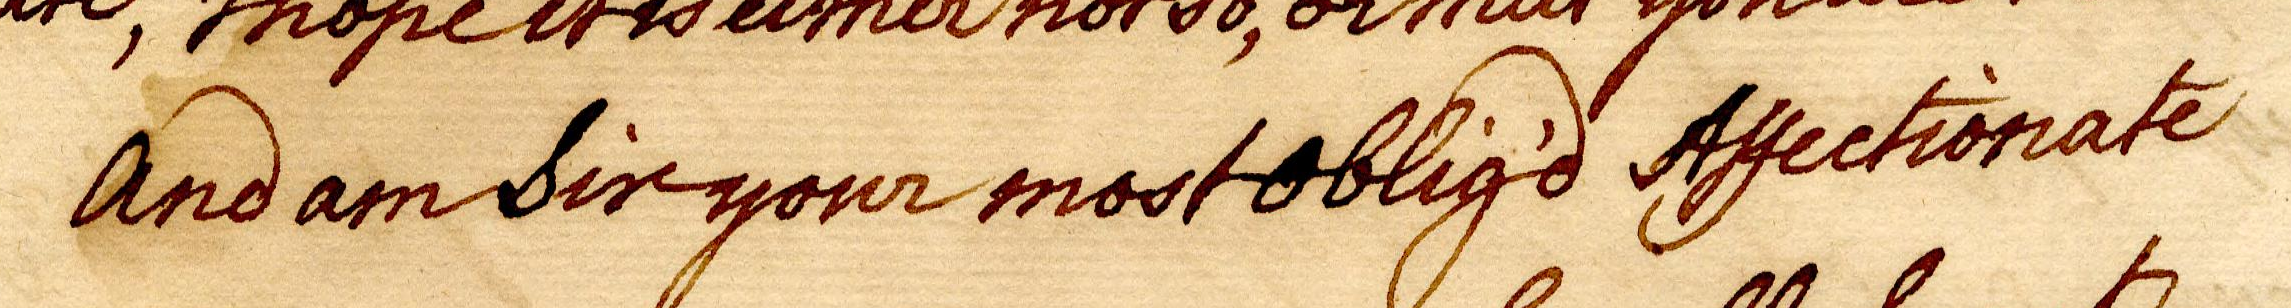And am Sir your most oblig'd Affectionate
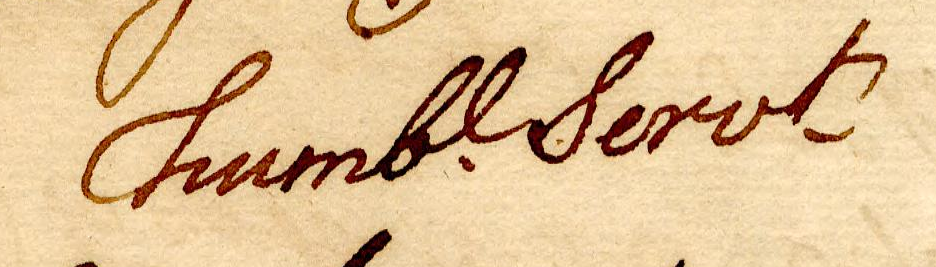humb^l. Serv^t.
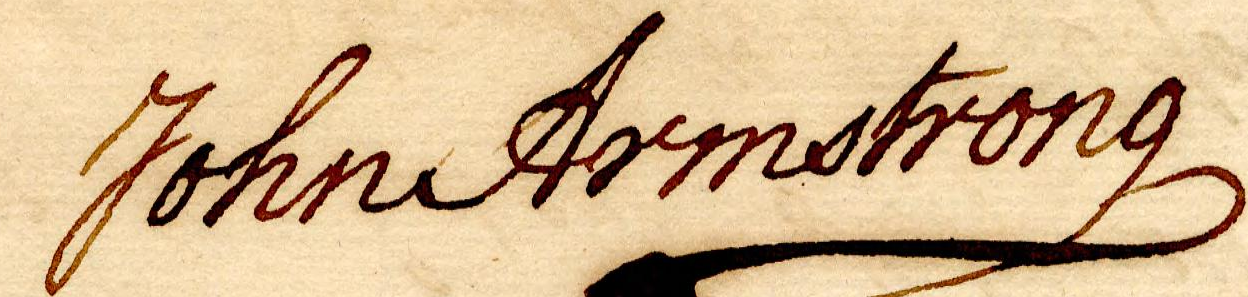John Armstrong
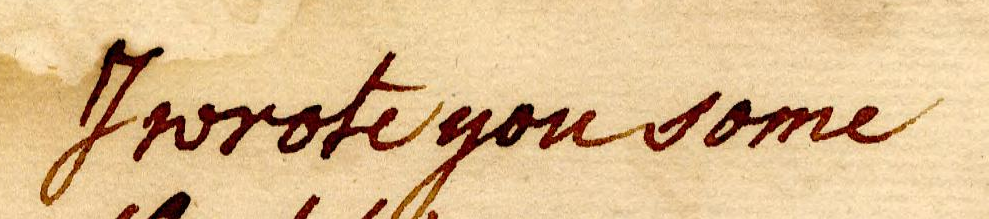I wrote you some
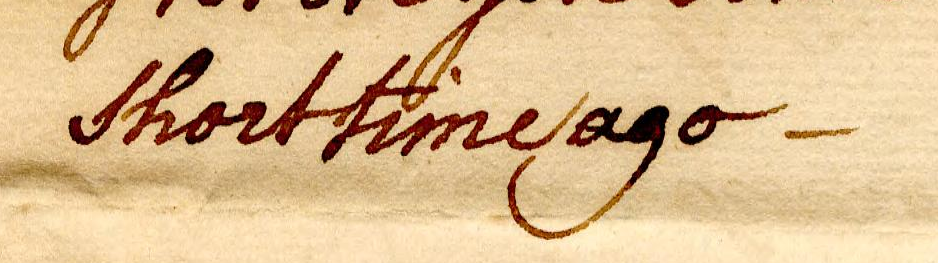short time ago -
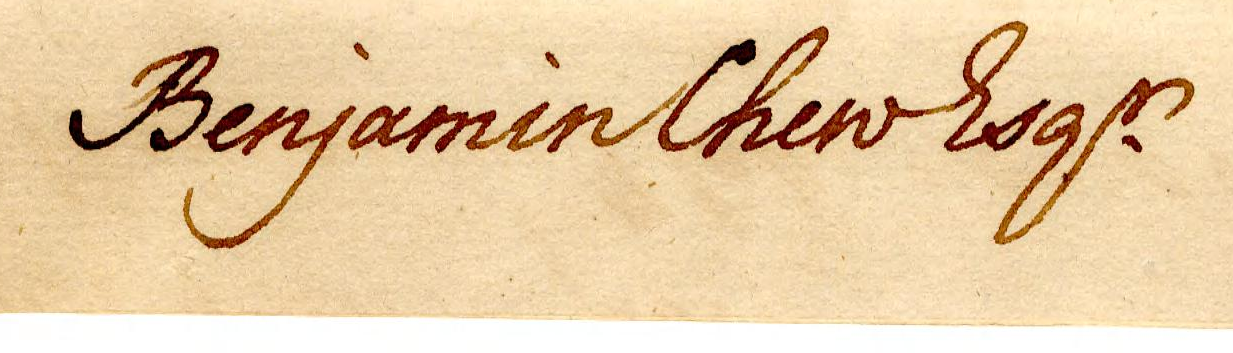Benjamin Chew Esq^r.
